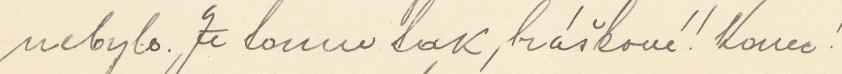nebylo. Je tomu tak, bráškové! Konec!
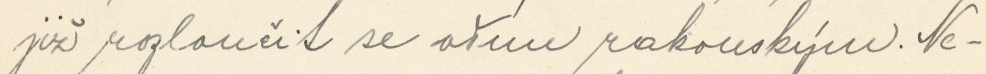již rozloučit se vším rakouským. Ne-
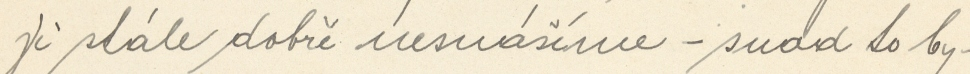ji stále dobře nesnášíme - snad to by-
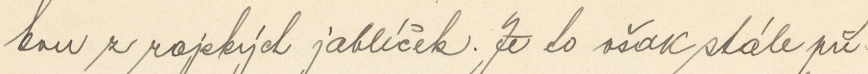kou z rajských jablíček. Je to však stále pří-
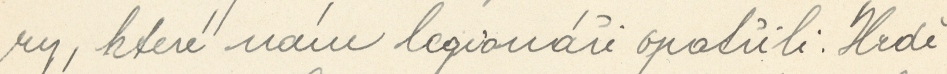ry, které nám legionáři opatřili. Hrdě
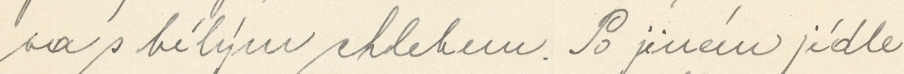va s bílým chlebem. Po jiném jídle
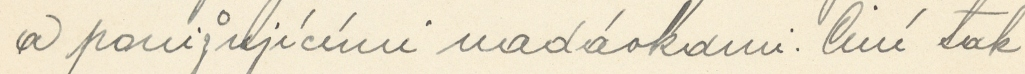a ponižujícími nadávkami. Činí tak
